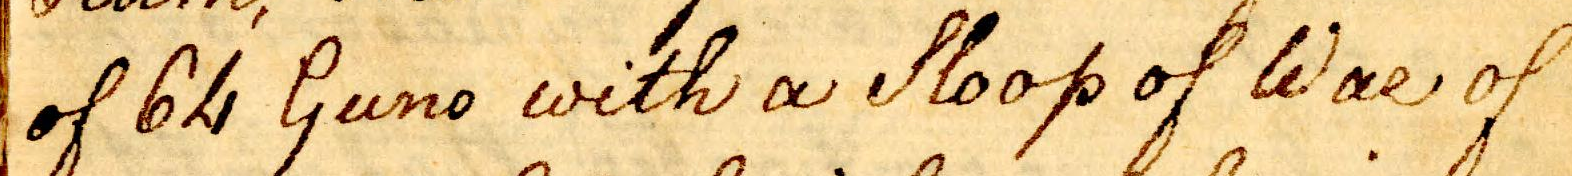of 64 Guns with a Sloop of War of
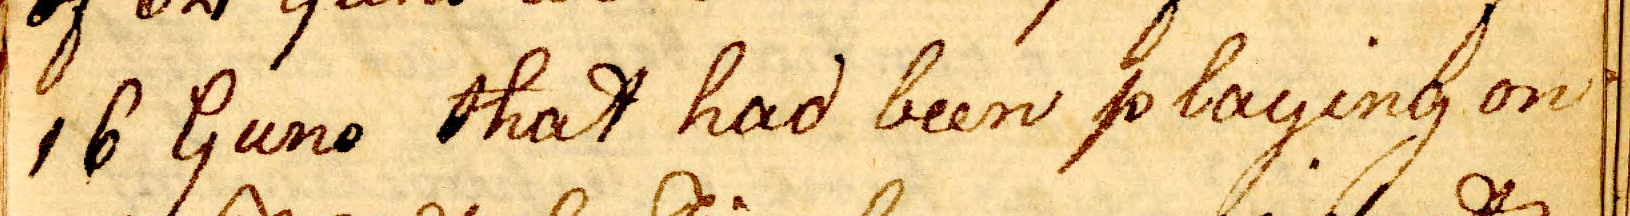16 Guns that had been playing on
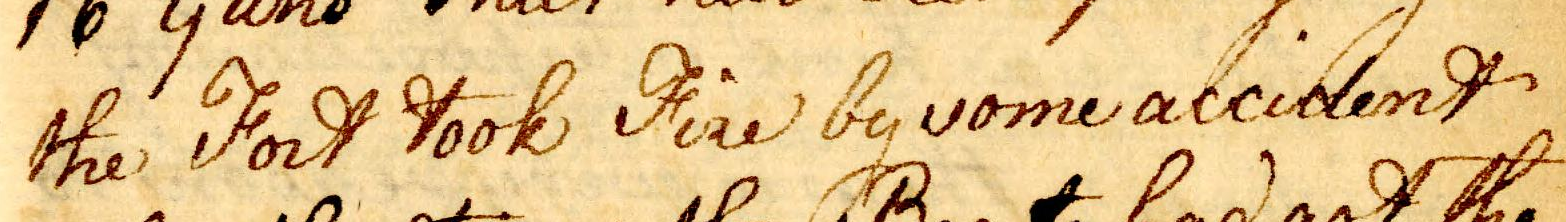the Fort took Fire by some accident
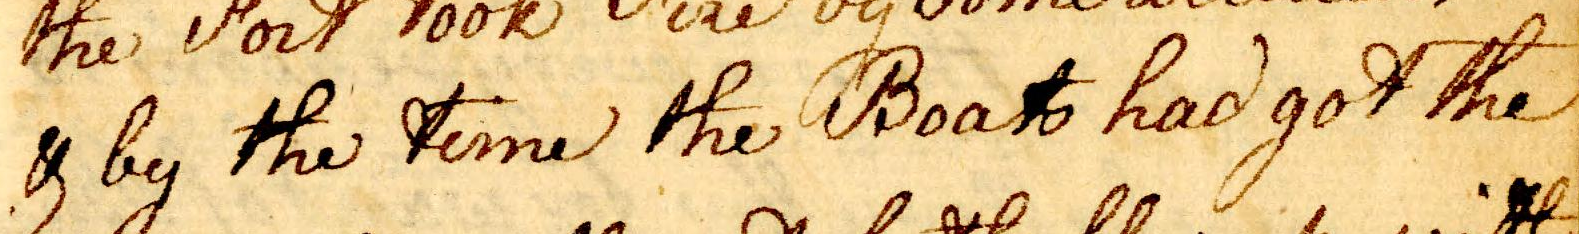& by the time the Boats had got the
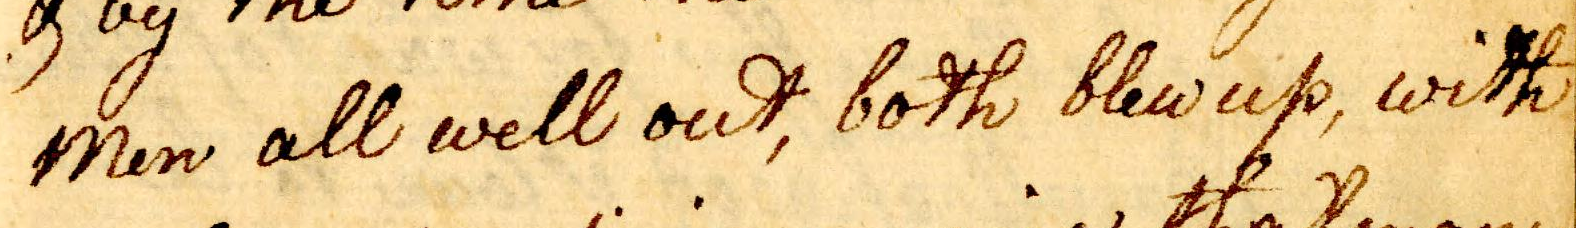Men all well out, both blewup, with
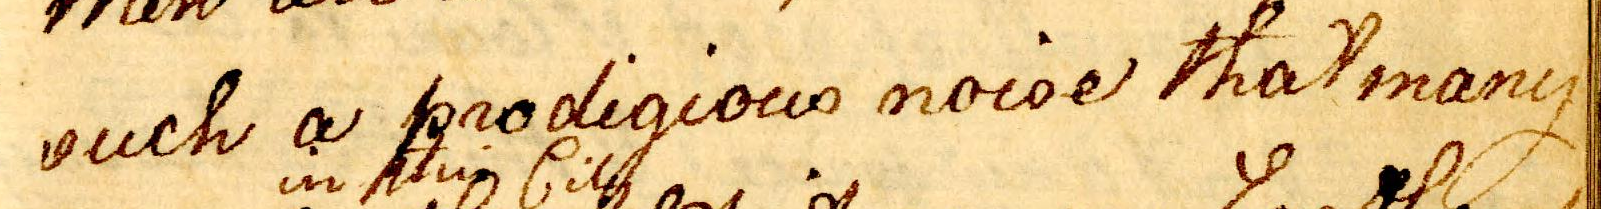such a prodigious noise that many
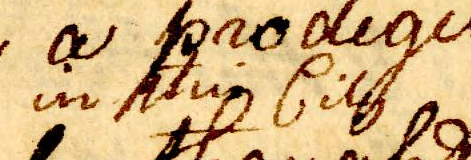in this City
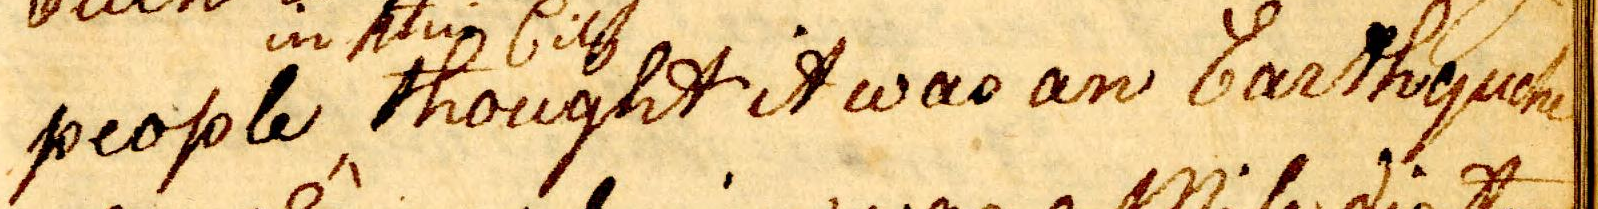people ^ thought it was an Earthquake
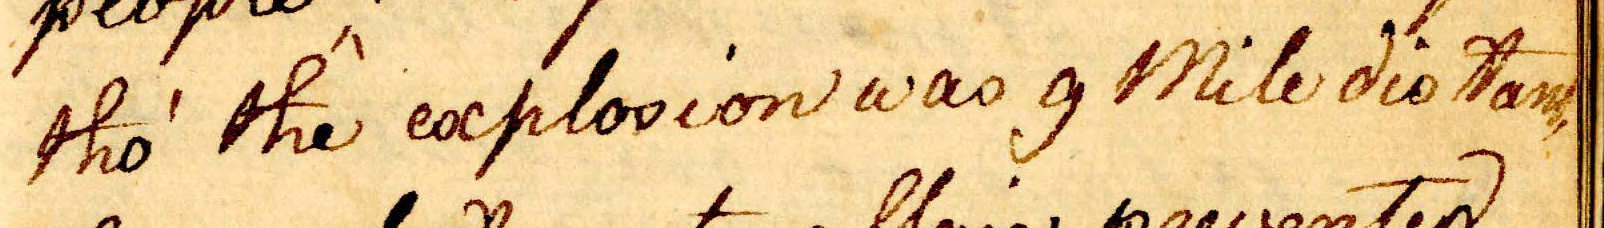tho' the explosion was 9 Mile distance,
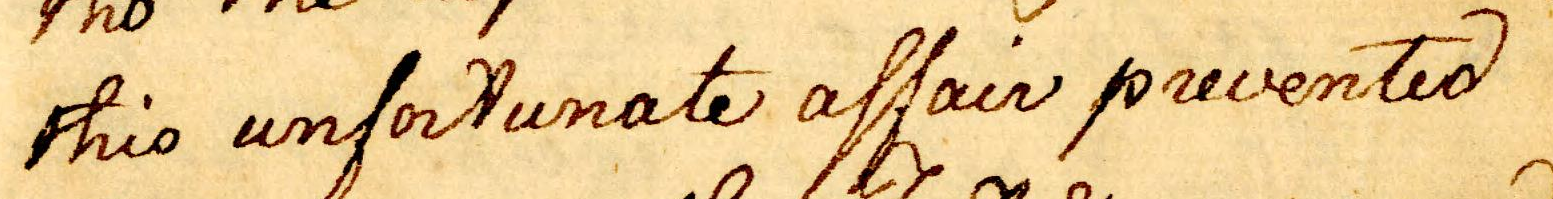this unfortunate affair prevented
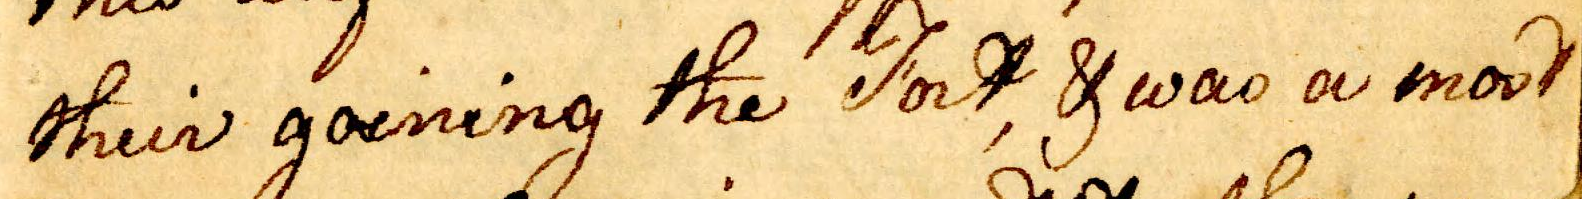their goining the Fort & was a most
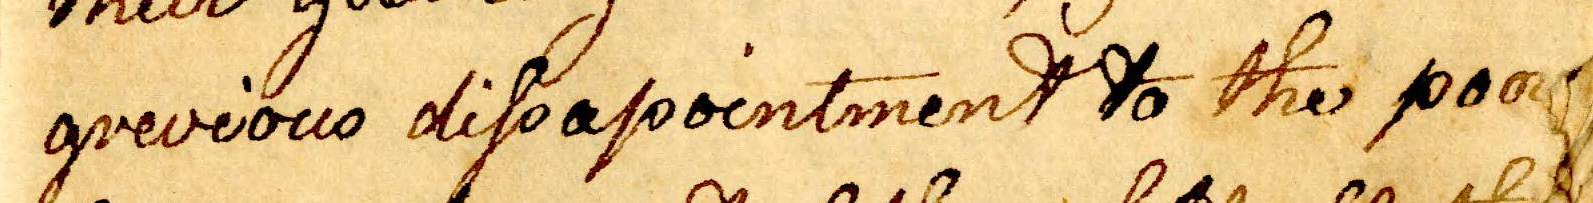grevious dissapointment to the poor
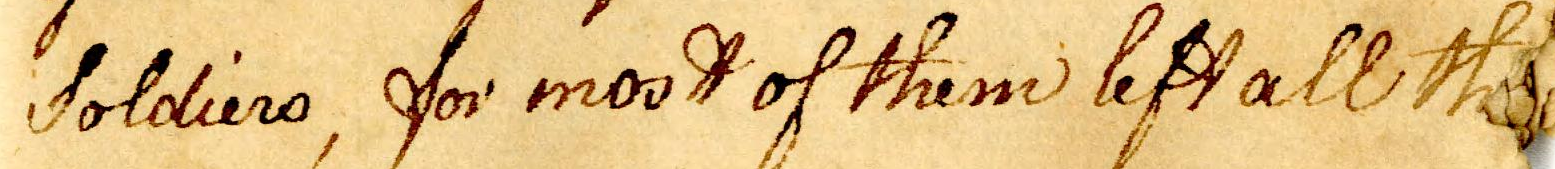Soldiers, for most of them left all th
